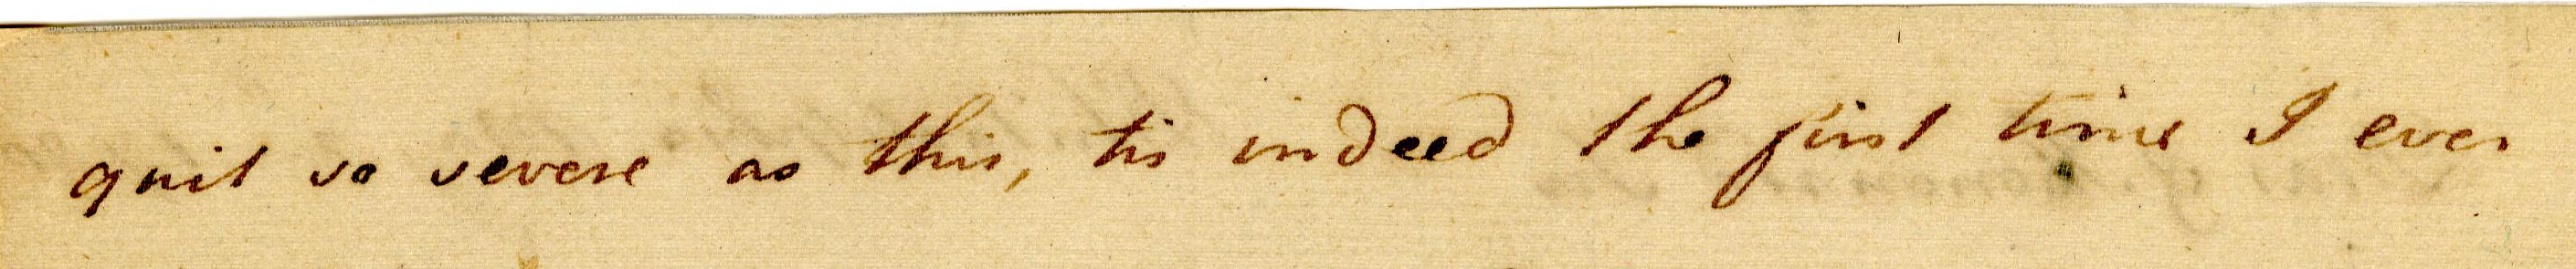quit so severe as this, tis indeed the first time I ever
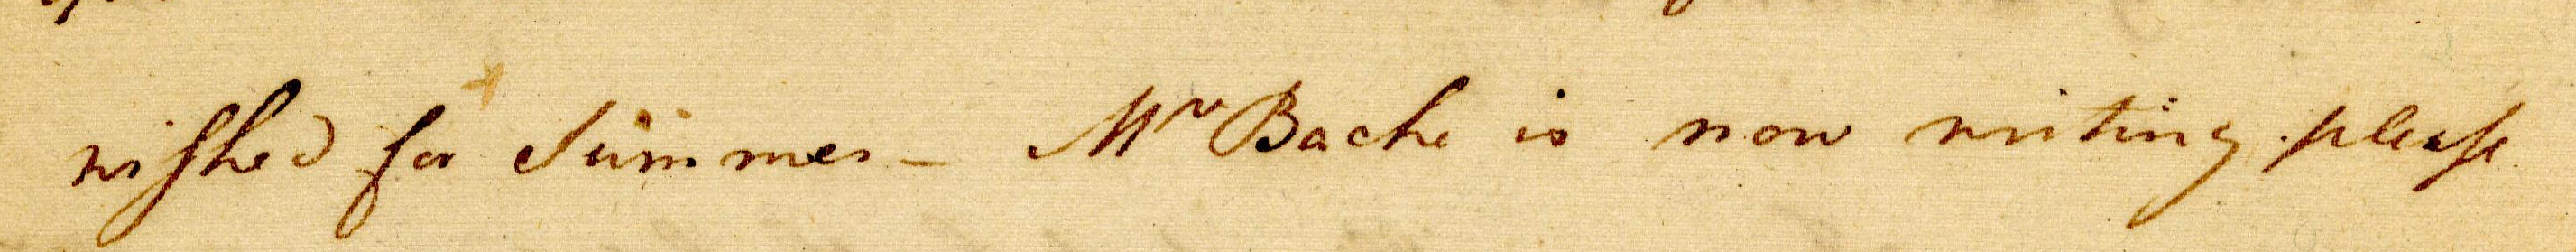wished for Summer- M^r Bache is now writing please
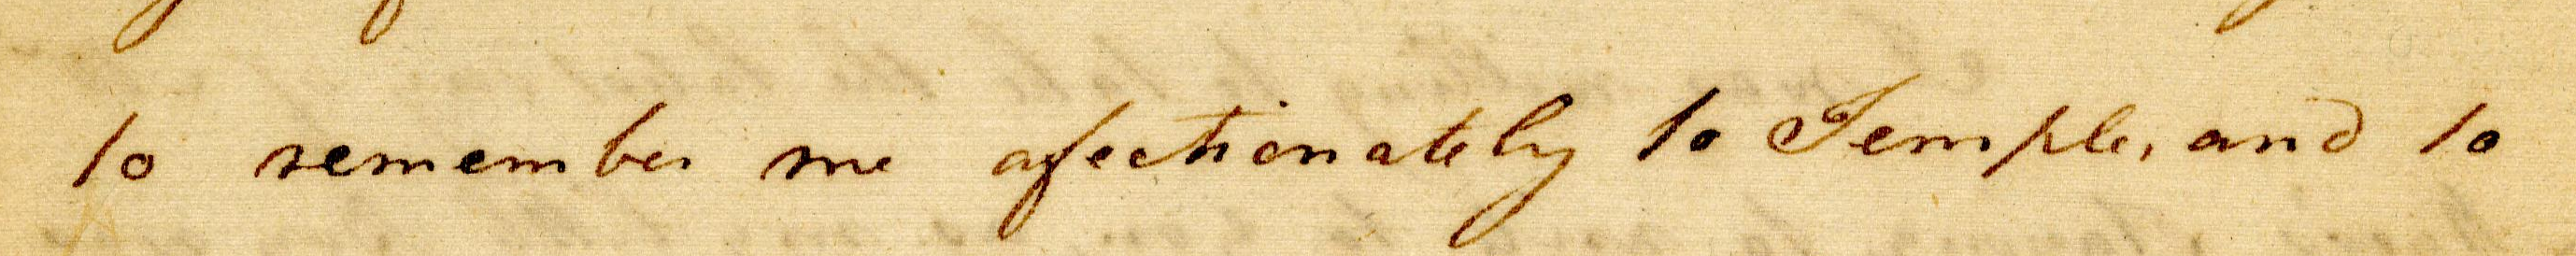to remember me afectionately to Temple, and to
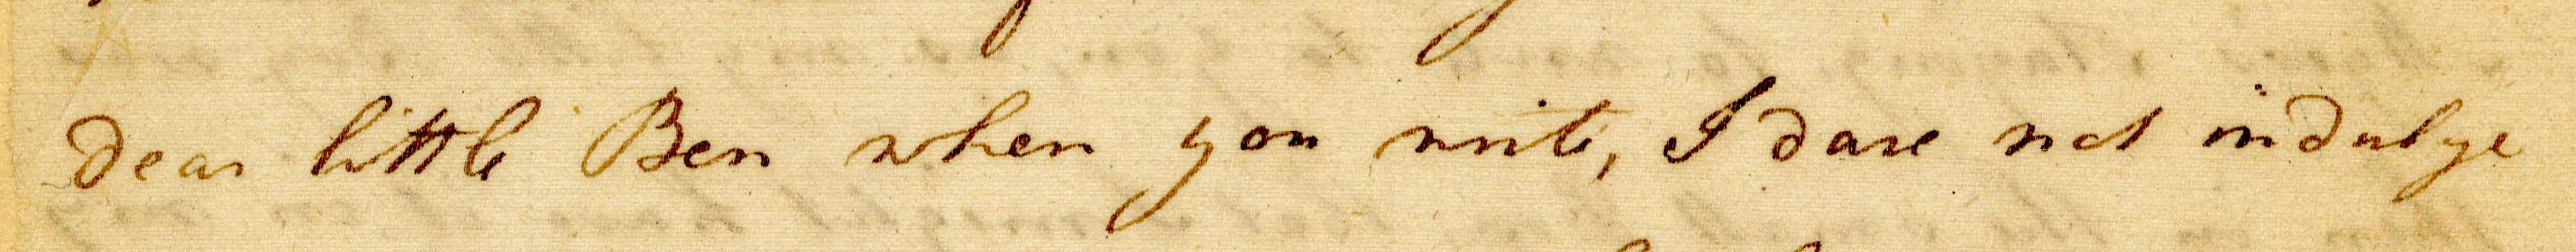dear little Ben when you write, I dare not indulge
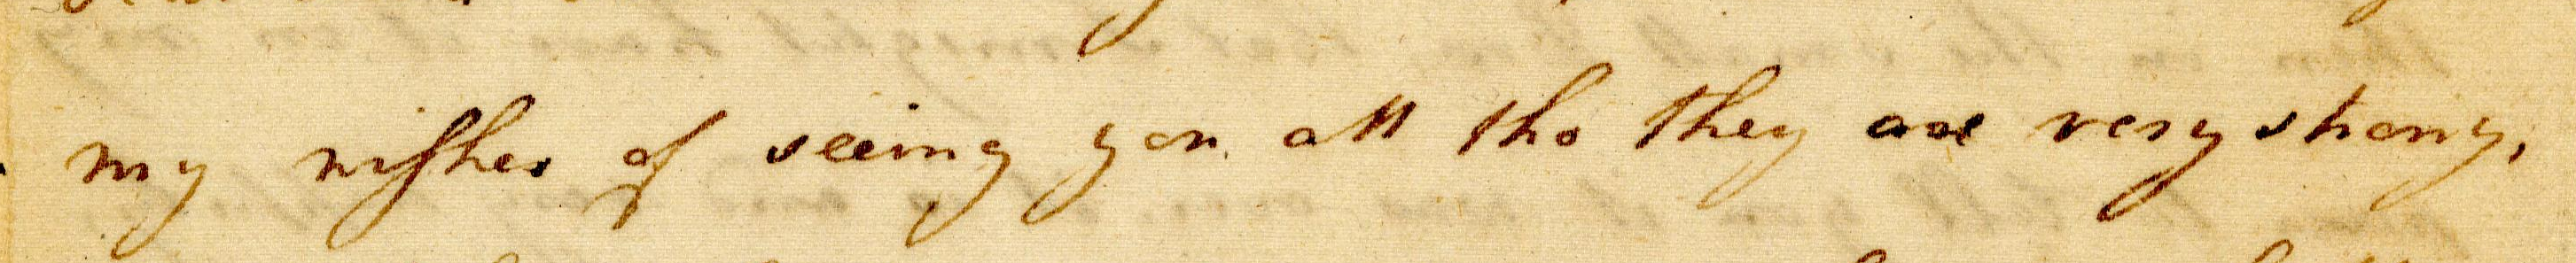my wishes of seeing you all tho they are very strong,
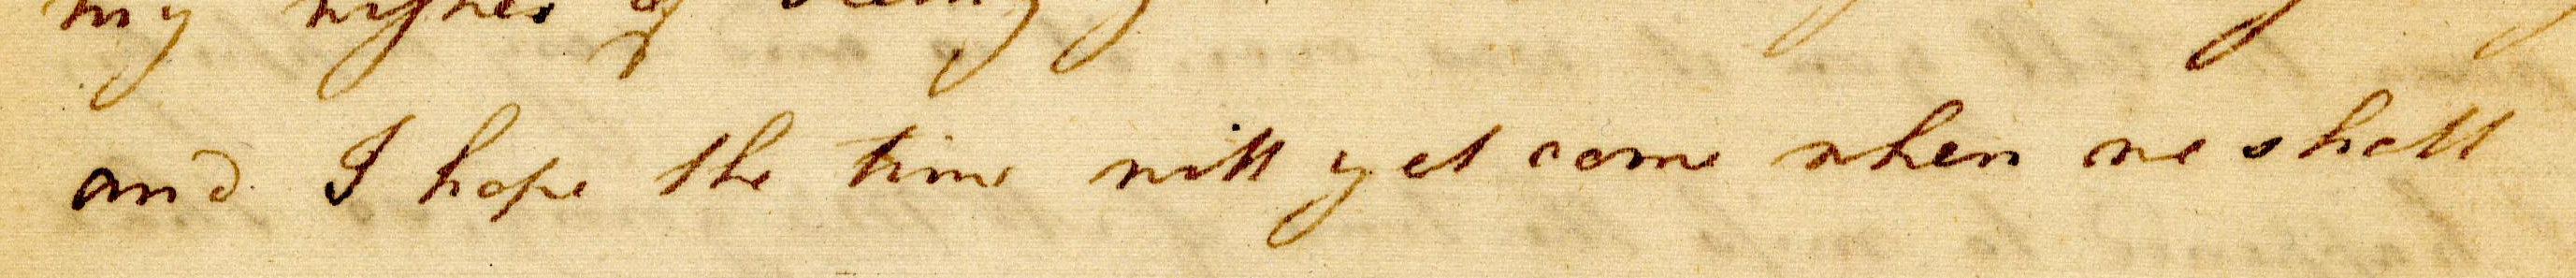and I hope the time will yet come when we shall
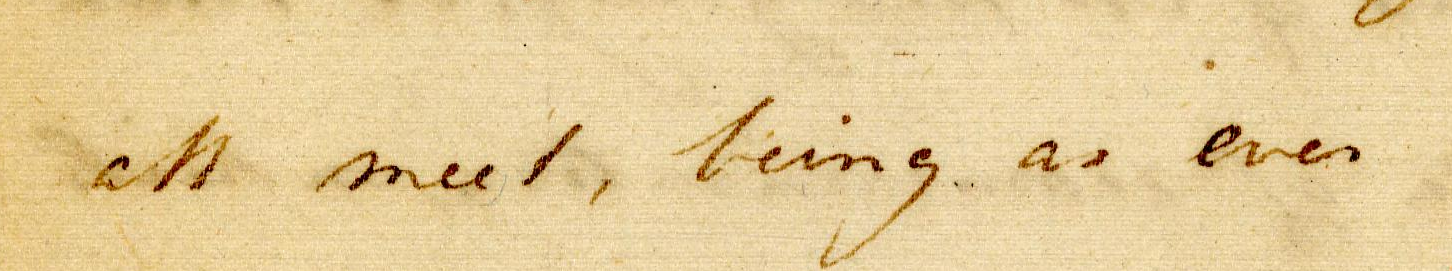all meet, being as ever
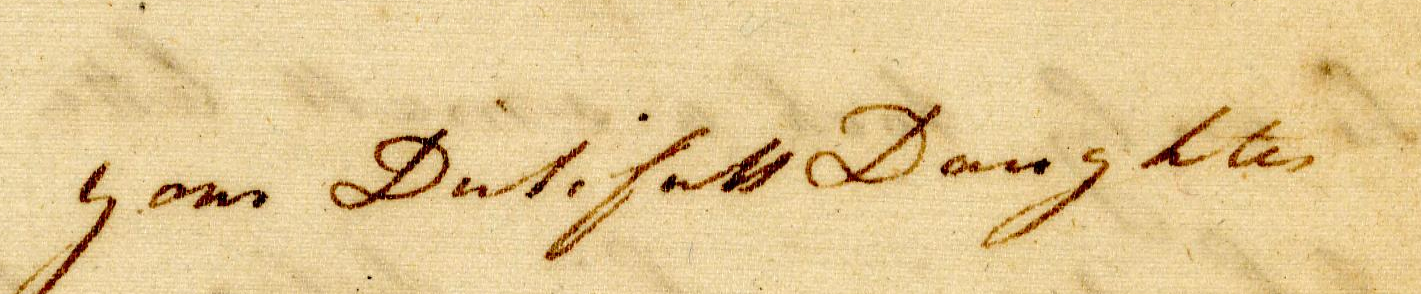your Dutifull Daughter
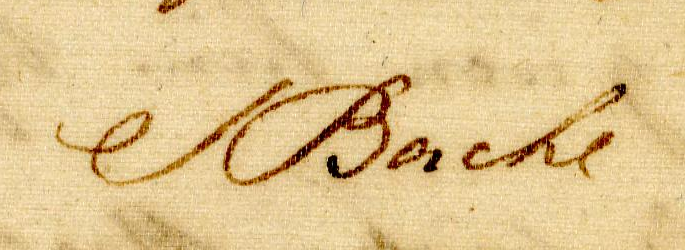S Bache
